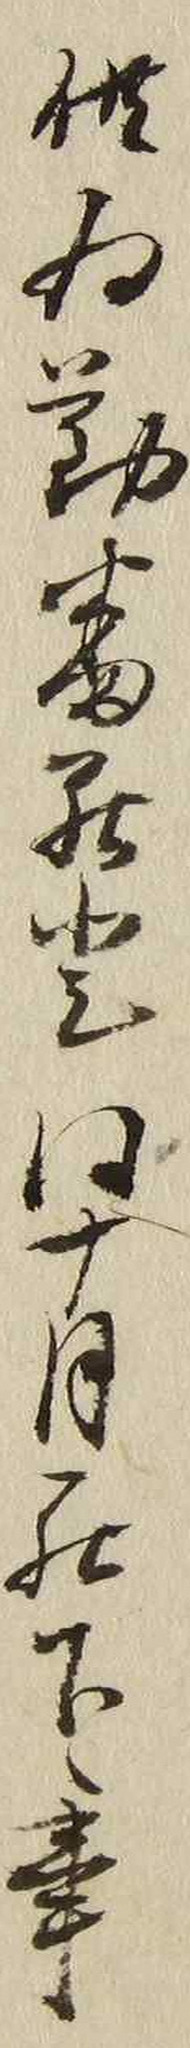供為勤番罷登同十月罷下候事
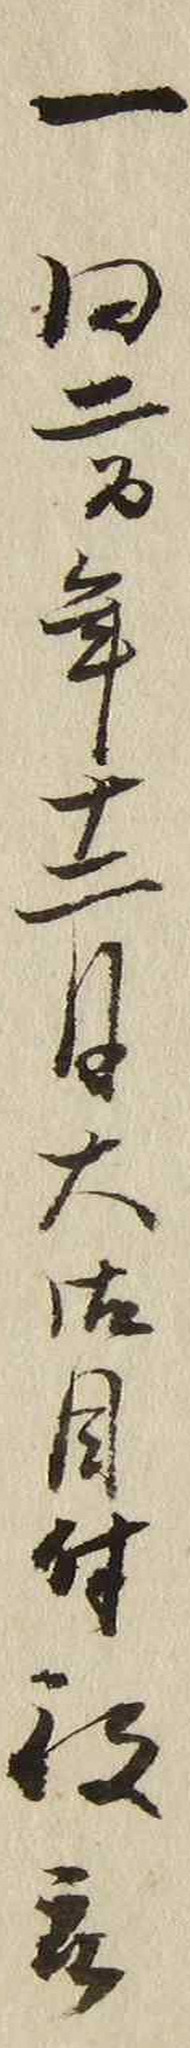一同二酉年十二月大御目付役被
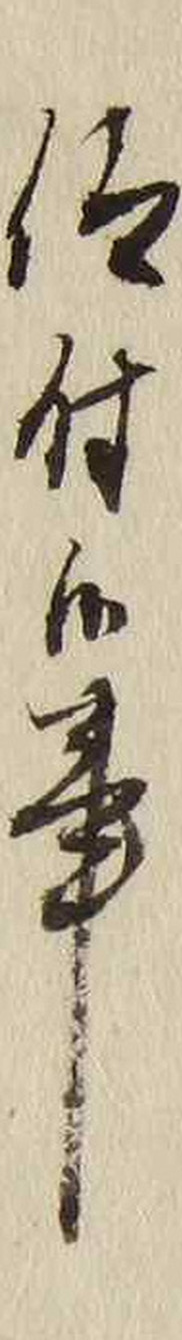仰付候事
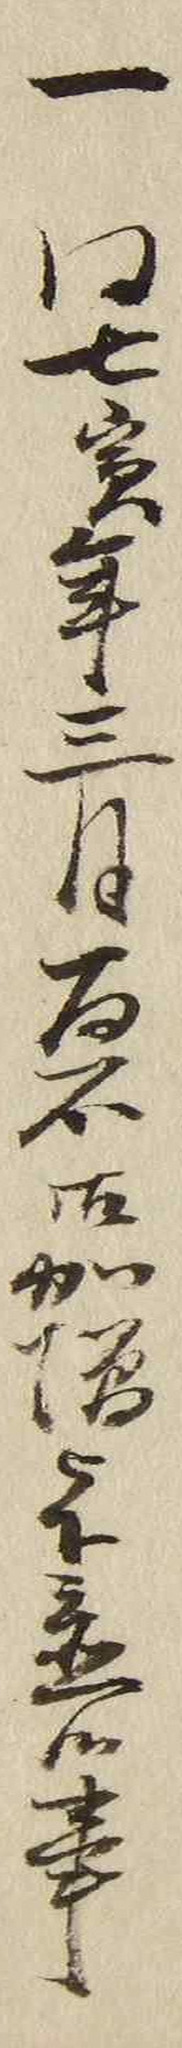一同七寅年三月百石御加増被下置候事

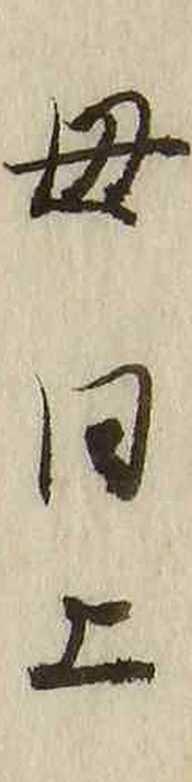母同上
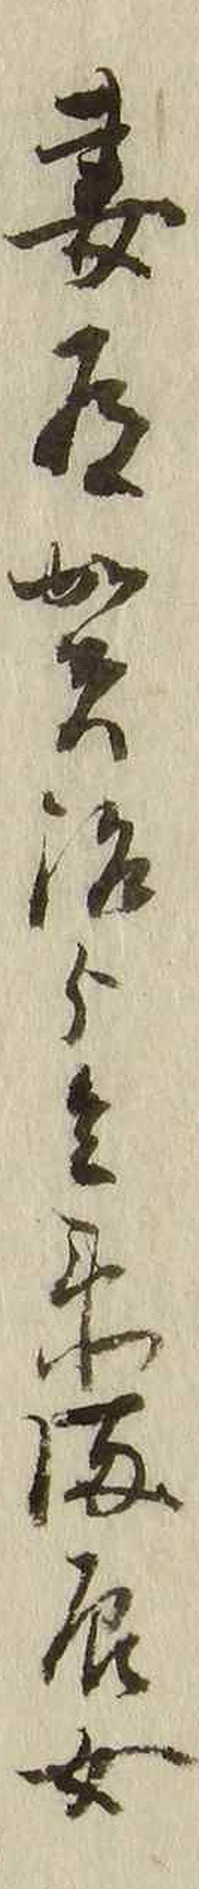妻有賀治郎兵衛満辰女
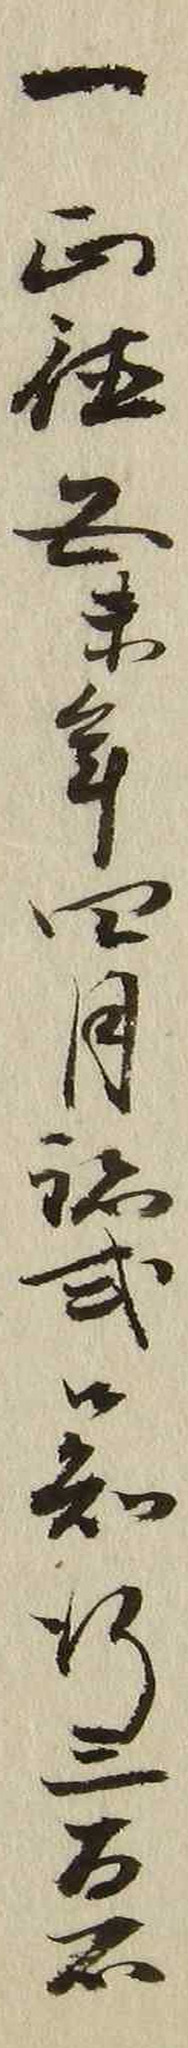一正徳五未年四月跡式御知行三百石
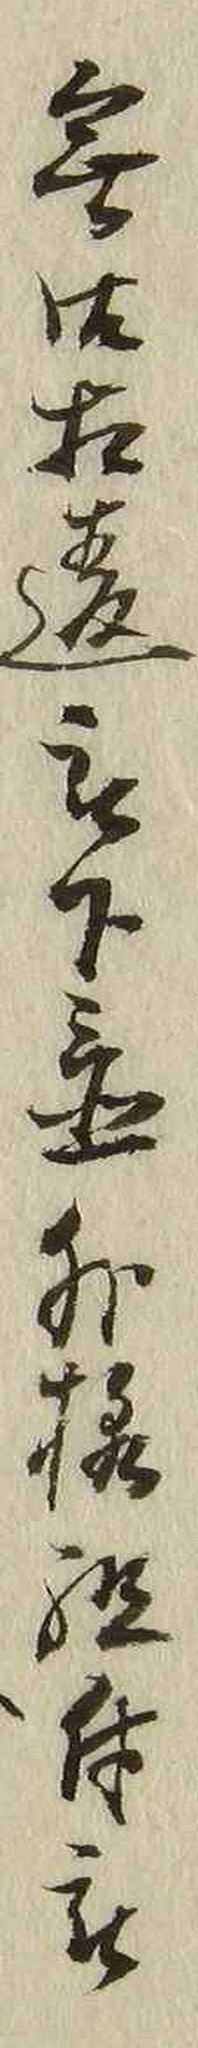無御相違被下置外様組付被
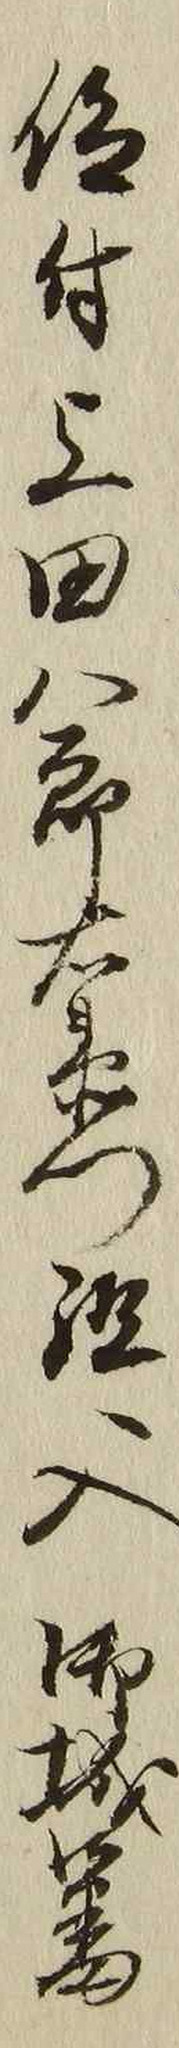仰付上田八郎右衛門組へ入御城御番
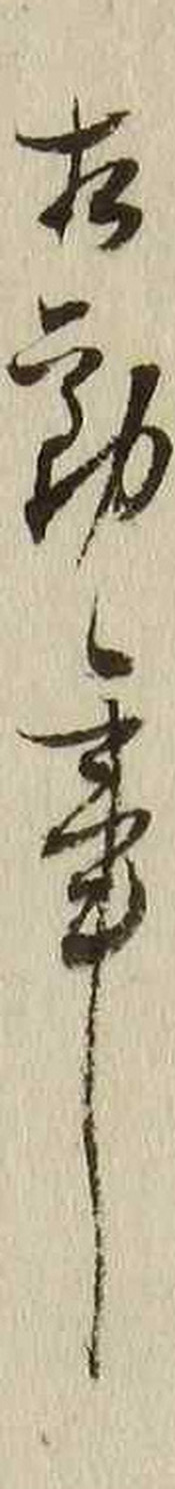相勤候事
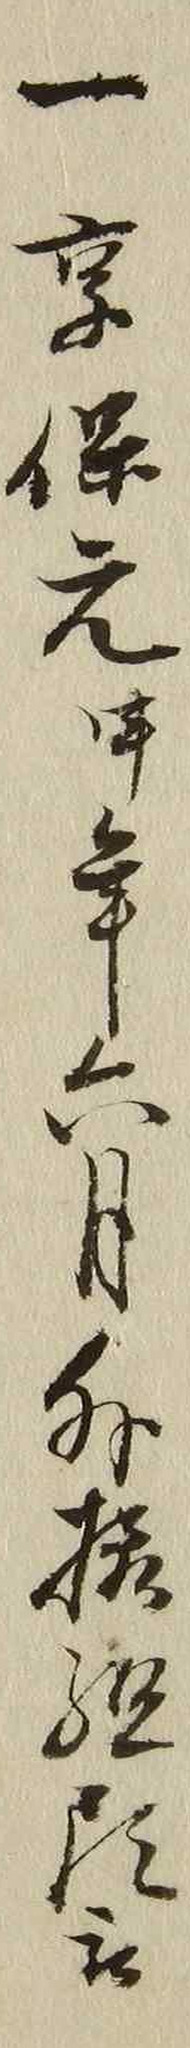一享保元申年六月外様組頭被
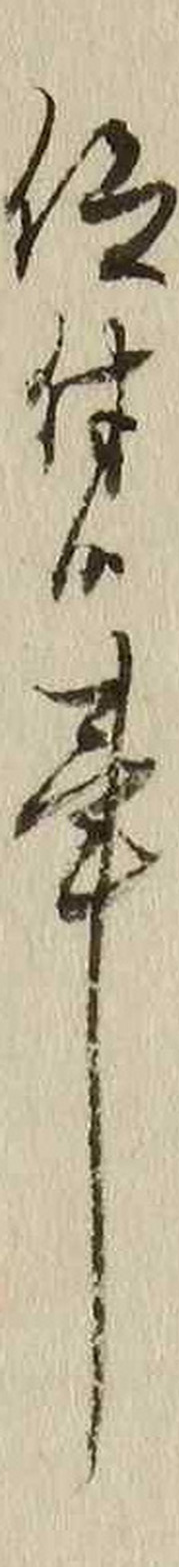仰付候事
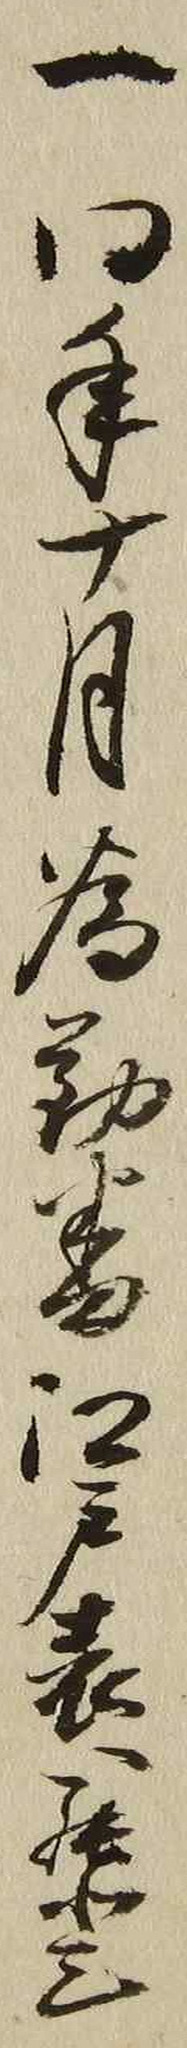一同年十月為勤番江戸表へ罷登
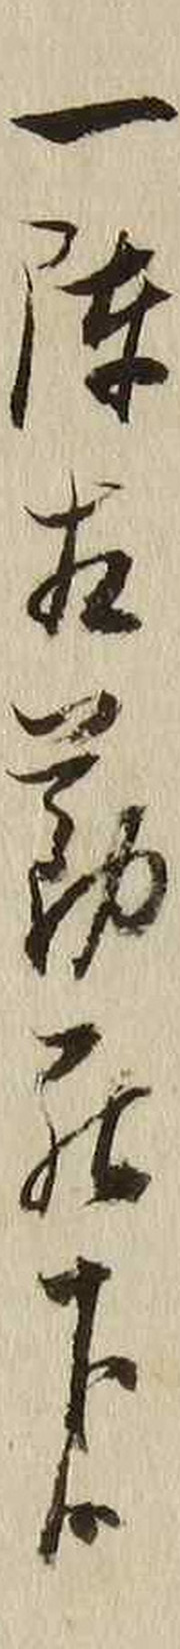一陣相勤罷下候
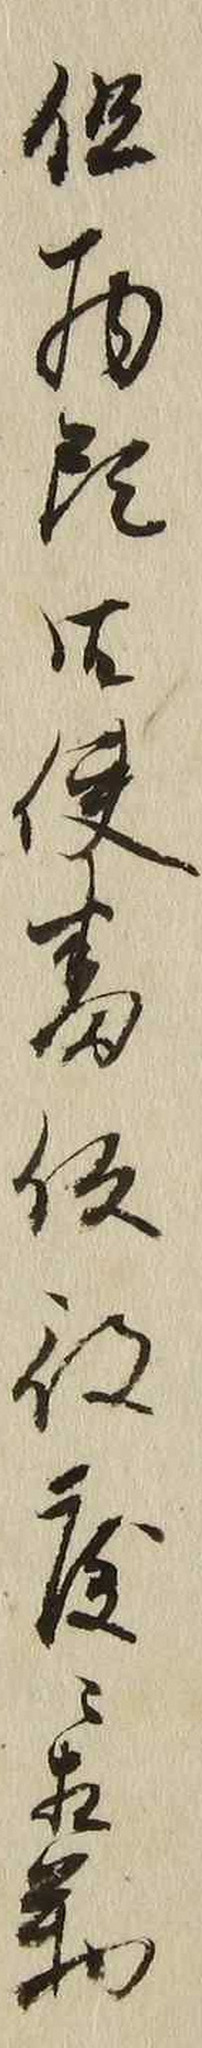但物頭御使番仮役度々相勤
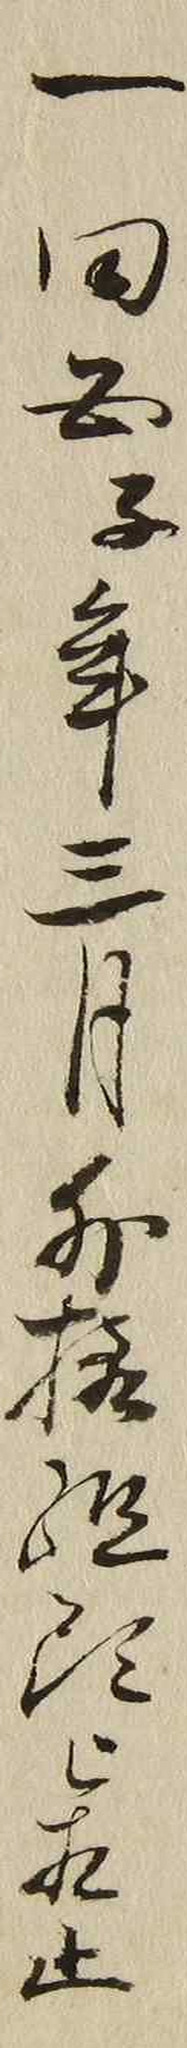一同五子年三月外様組頭被相止
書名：諸士系譜　巻之348　も之部4
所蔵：会津若松市立会津図書館
